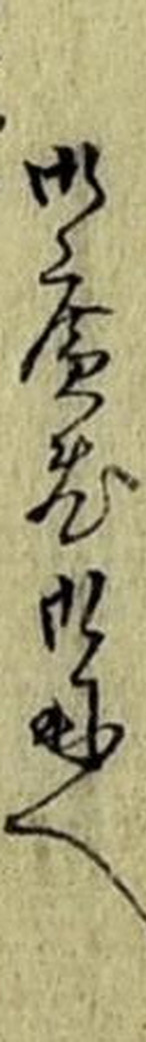御広敷御用人
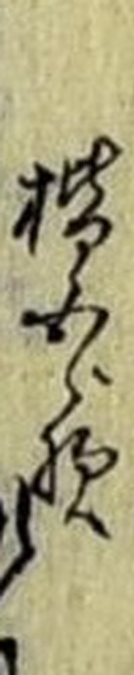揩五郎様
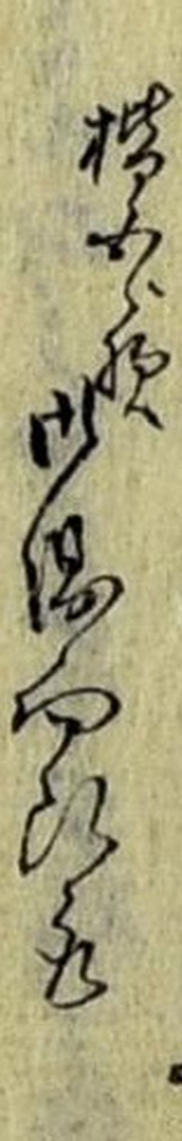御側向頭取
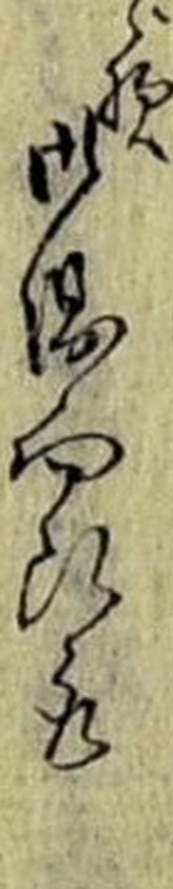御側向頭取
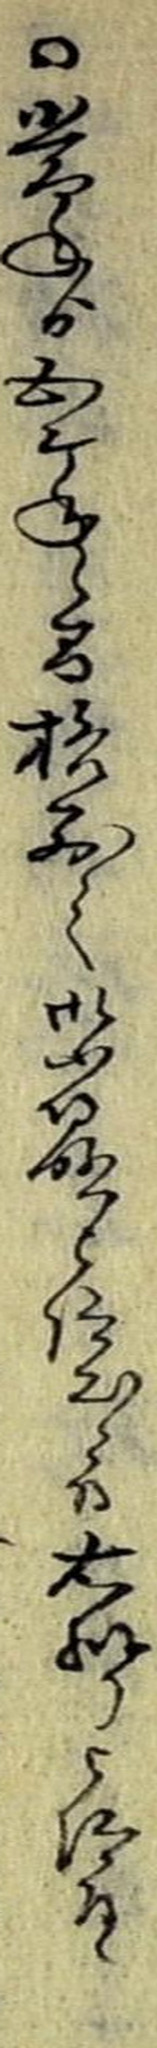○当年ゟ五ヶ年之間各別之御省略被仰出候に付右掛り被仰付候
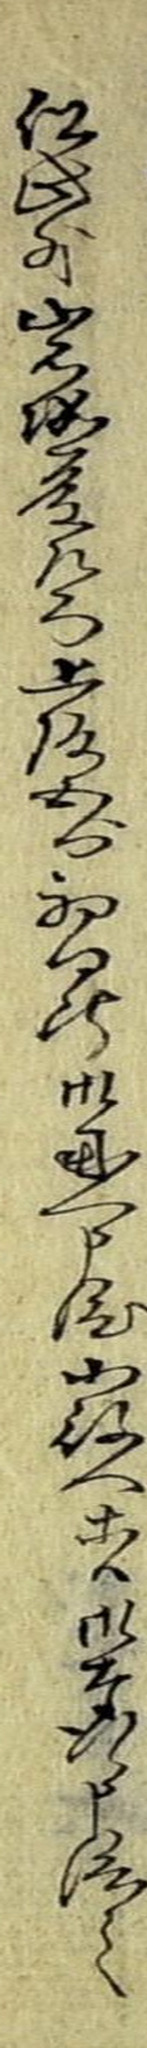但此外岩崎藤左衛門上坂五右衛門初同断御用人申渡小役人等は御奉行申渡之
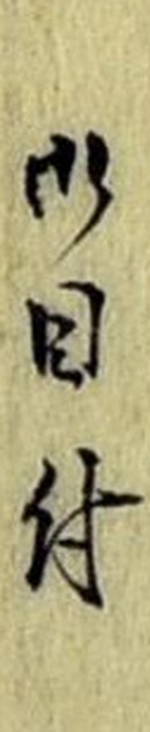御目付
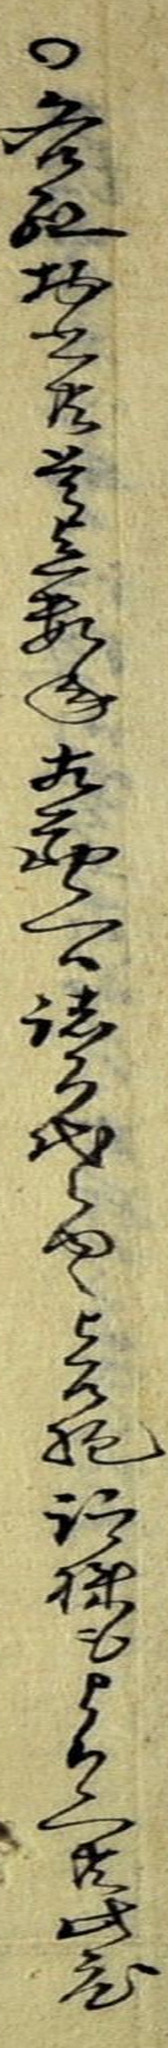○各組物書共是迄数年相勤候へは諸下代之内へ被召抱跡株も被下候へ共此度

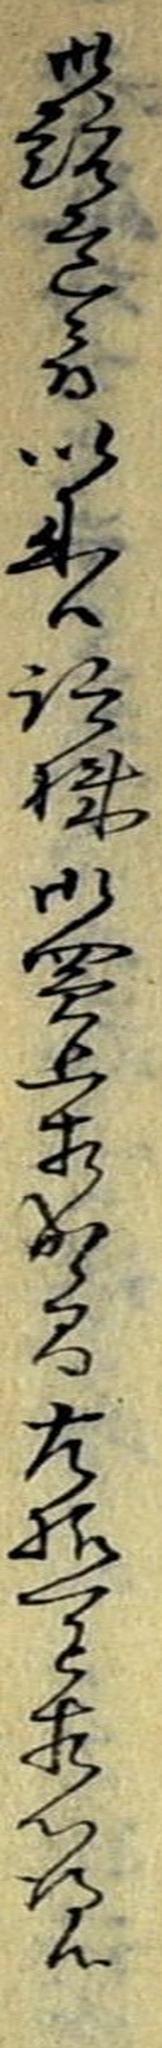御趣意に付以来は跡株御買上相成候間左様可被相心得候
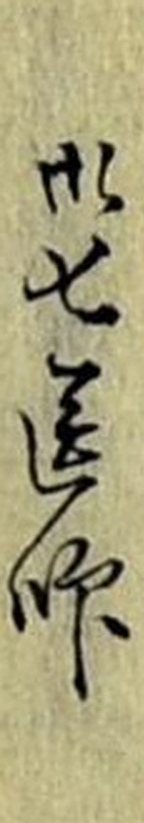御匕医師
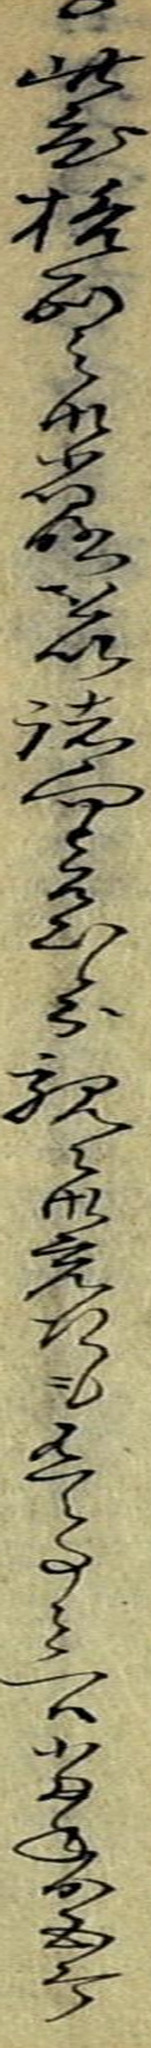○此度各別之御省略を以諸向差出候分親に御充行も有之事に候へは当年ゟ五ヶ
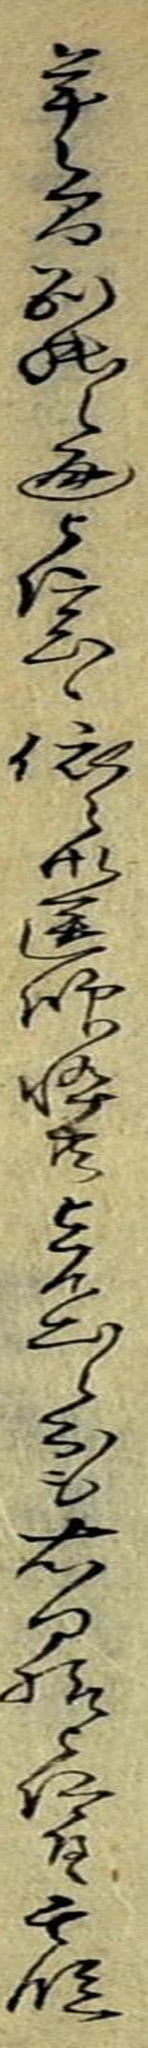年之間別紙之通被仰出候依之御医師忰共被差出候分も右同様被仰付候其段
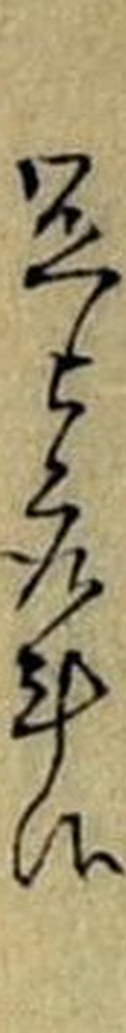宜被取斗候
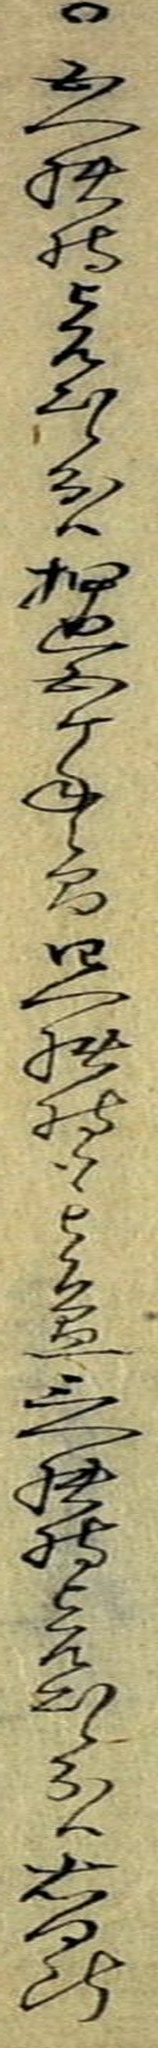○五人扶持差出候分は押廻五ヶ年之間四人扶持つヽ被下置三人扶持差出候分は右同断
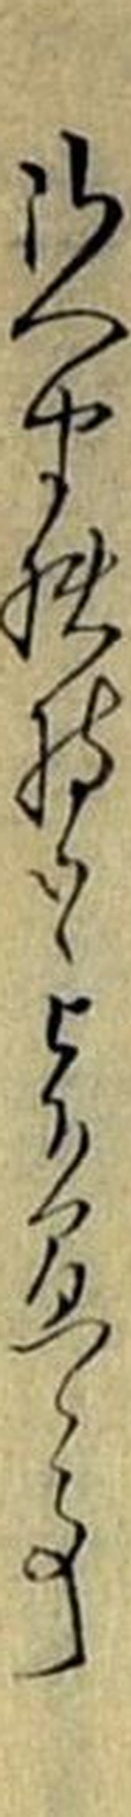弐人半扶持つヽ被下置候事
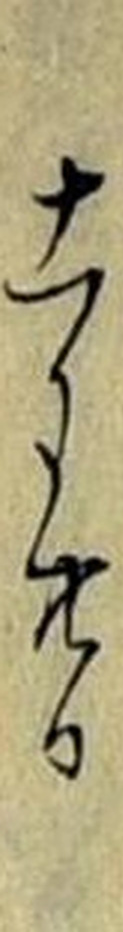十一月廿日
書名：命令之部 六
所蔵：福井県文書館 Fukui Prefectural Archives
